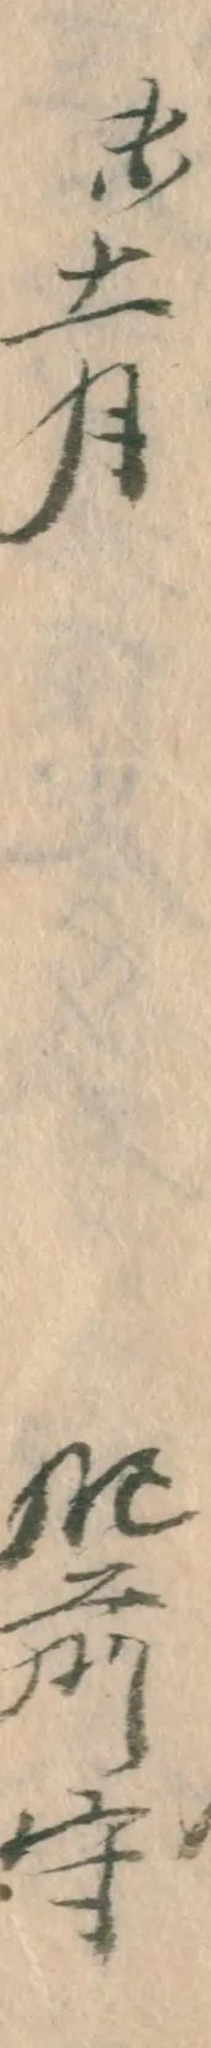未十一月肥前守
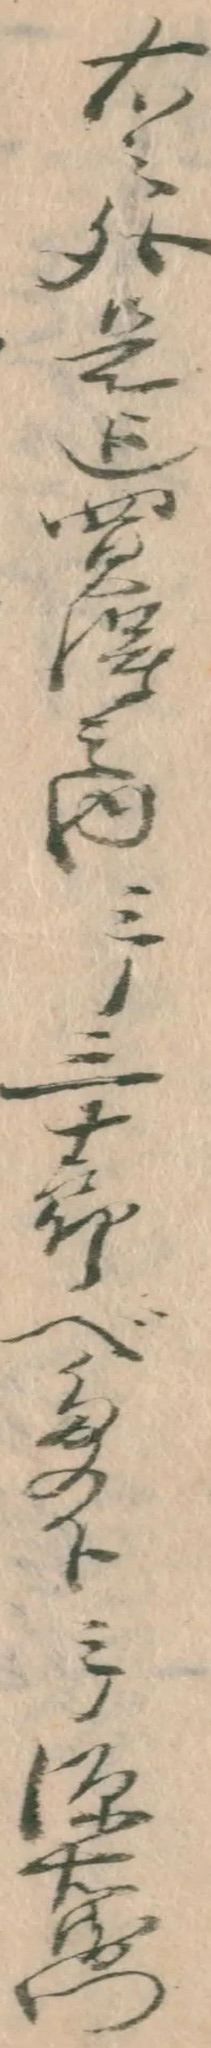右之外是迄買得之内三ノ三十郎べたの下三の源右衛門
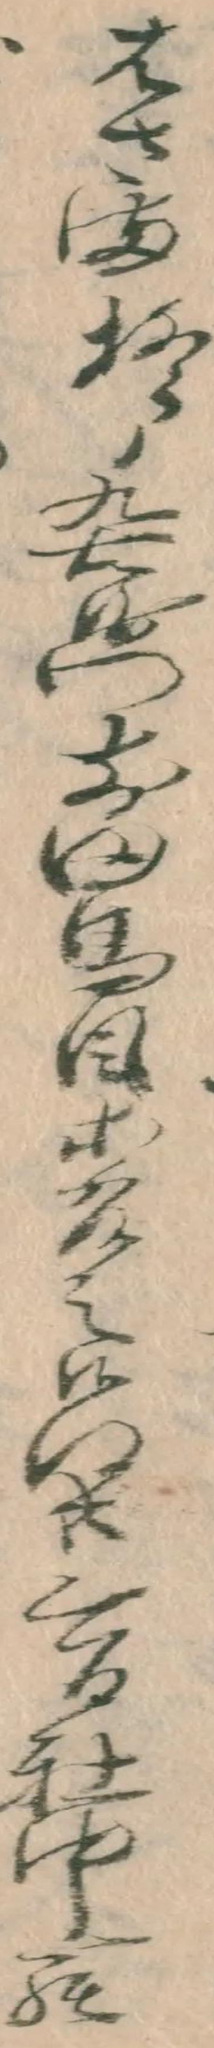はさま柊ノ九右衛門前田馬目等有之候得共今日社中罷
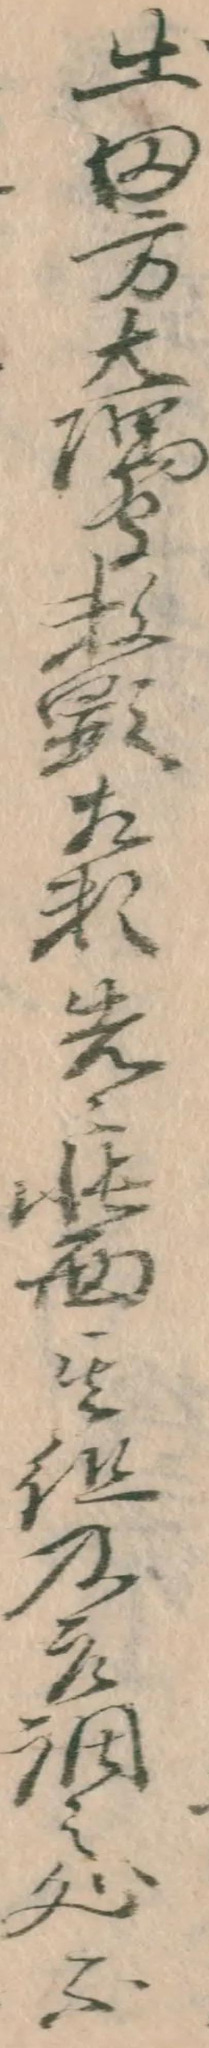出田方大隅守枝顕相頼先々帳面其組及差調之処不
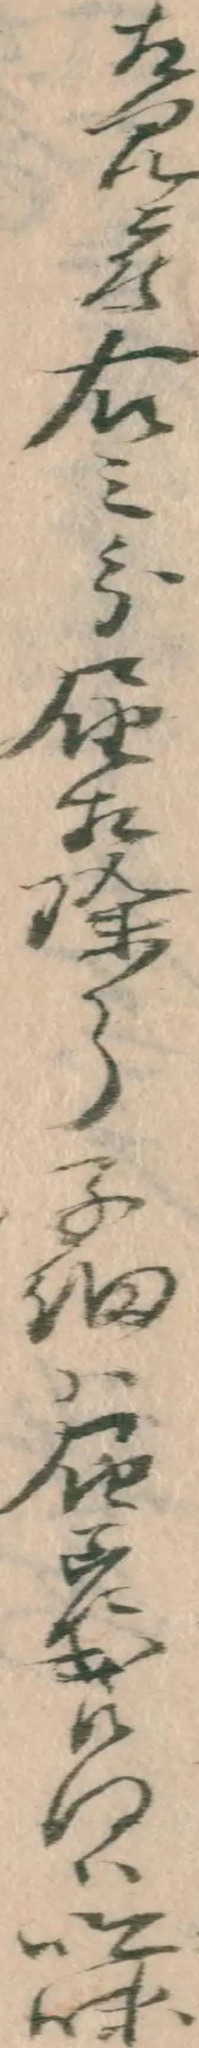相見ニ付右之分届相除了子細ハ届差出候得ハ吟味
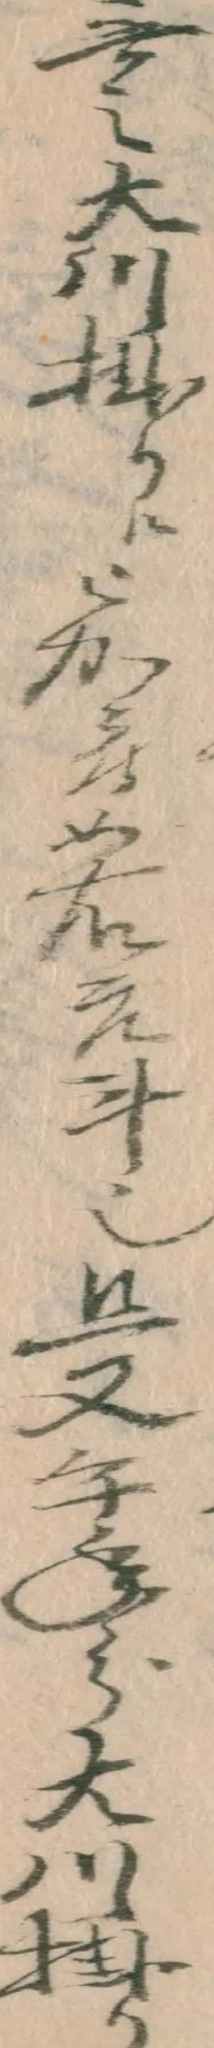無之大川掛り候被加ニ付如右差斗也且又午年分大川掛り
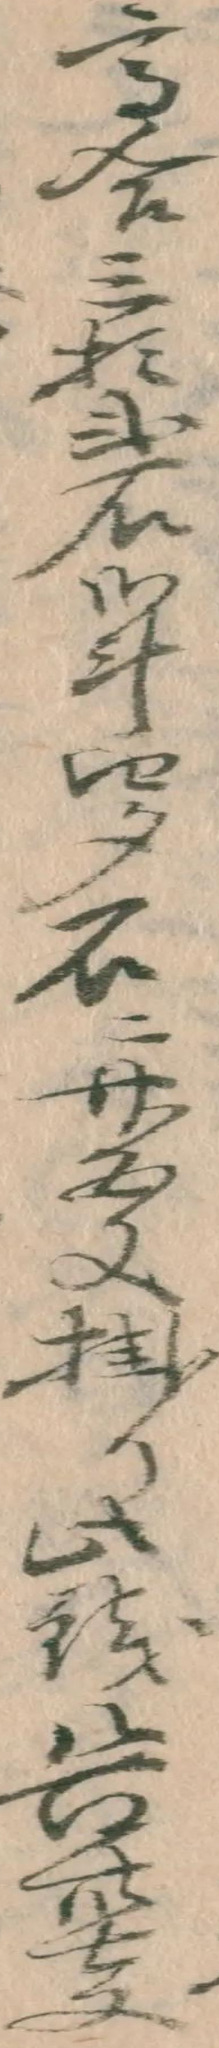高合三拾弐石弐斗四夕石二廿五文掛り此銭八百丗七文
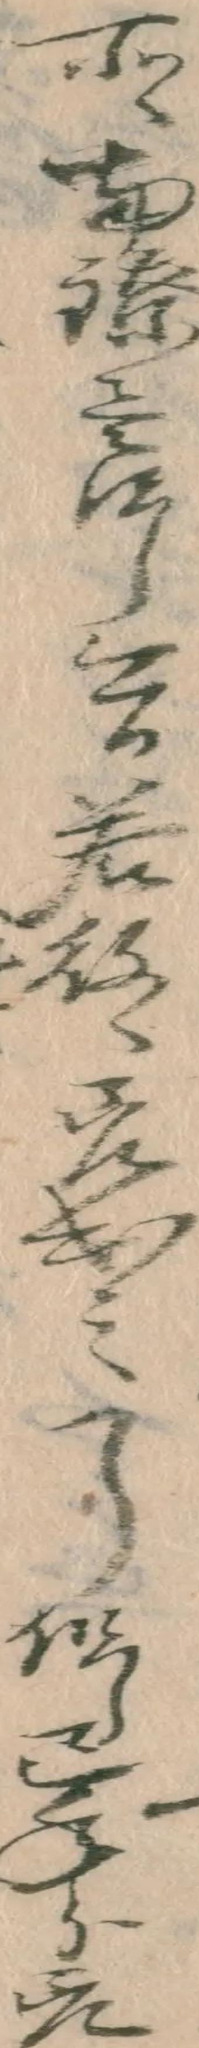所へ南鐐壱片今日若役へ差出之了但し巳年分差
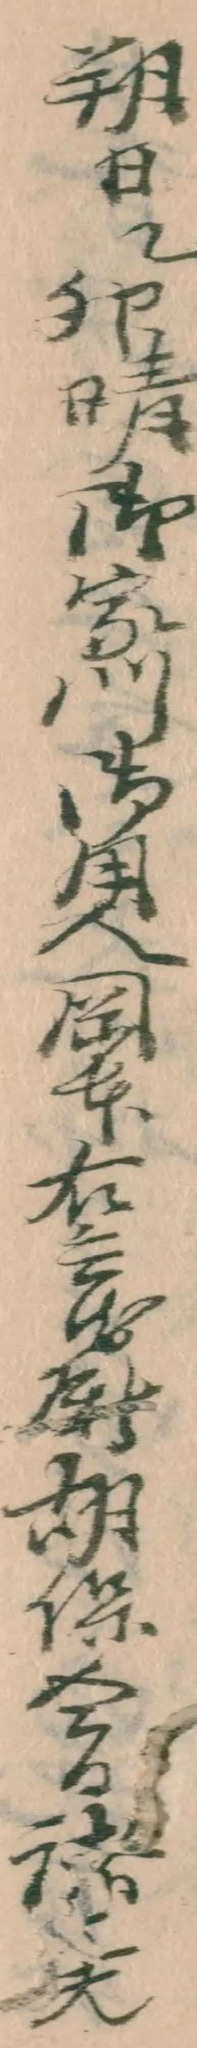朔日乙卯晴御家門御用人岡本右兵衛尉胡保今日諸大夫
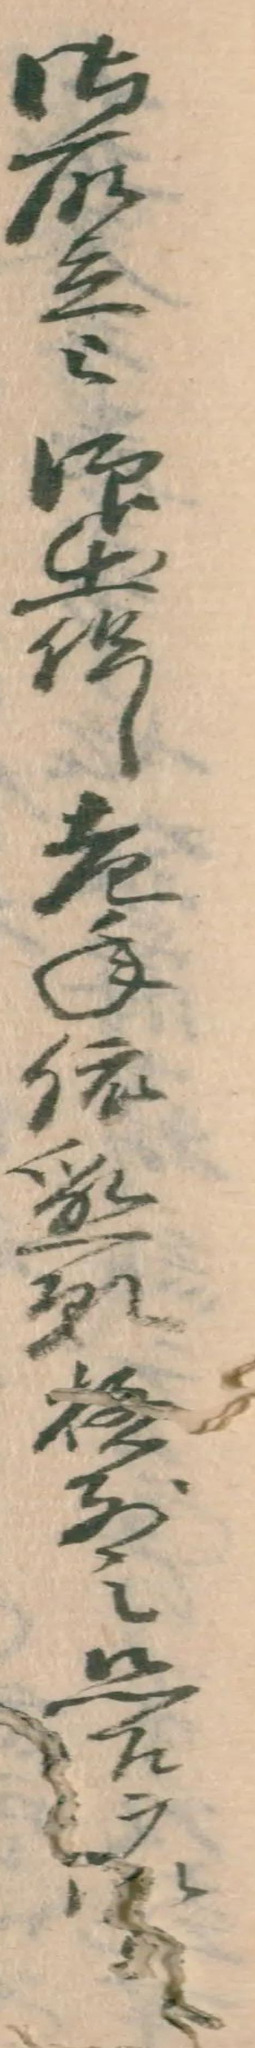御取立被仰出但し老年依懇願格別之思召ヲ以
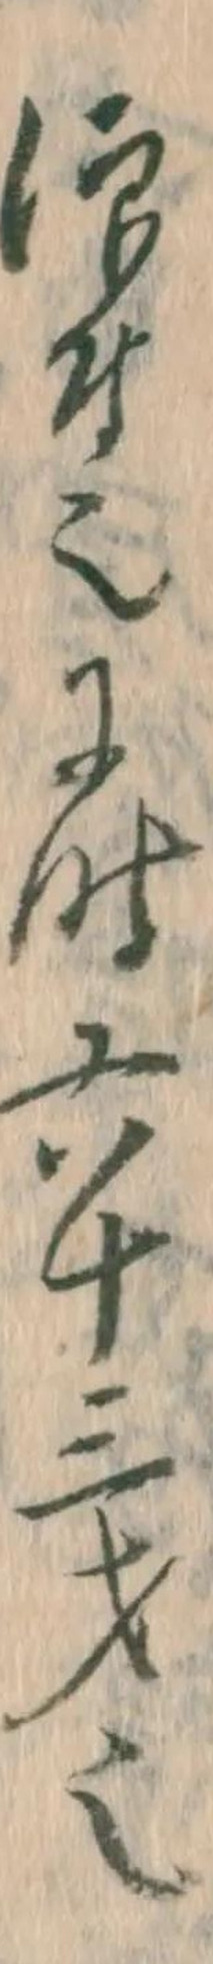仰付也于時六十三才也
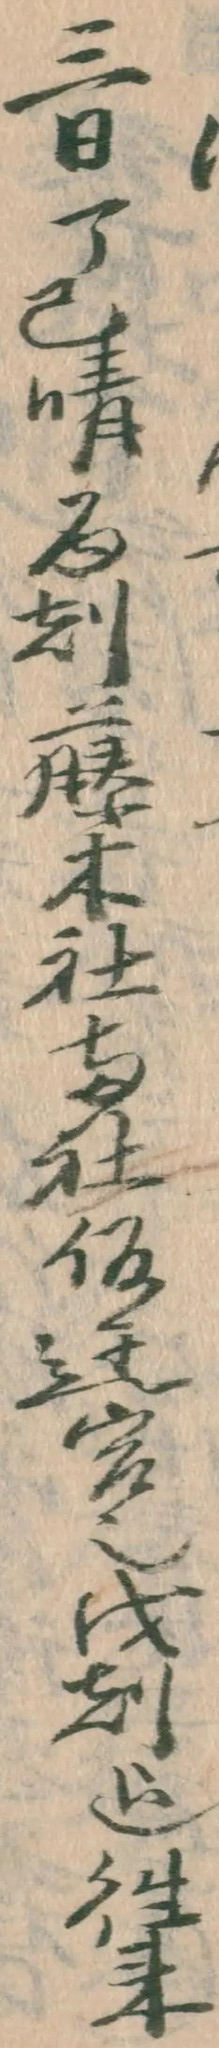三日丁巳晴酉刻藤木社両社仮遷宮也戌刻迄往来
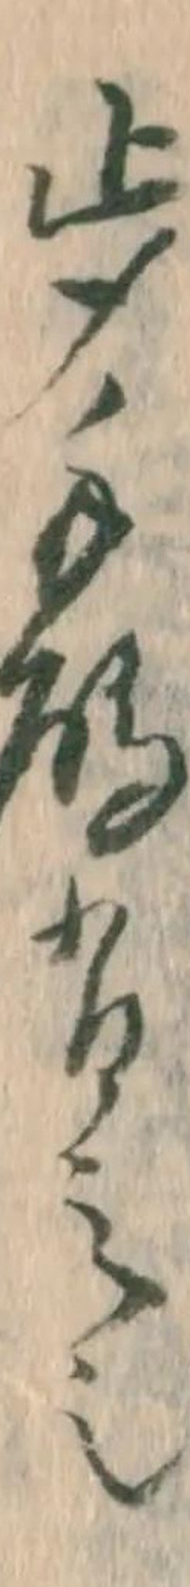止メ手觸有之也
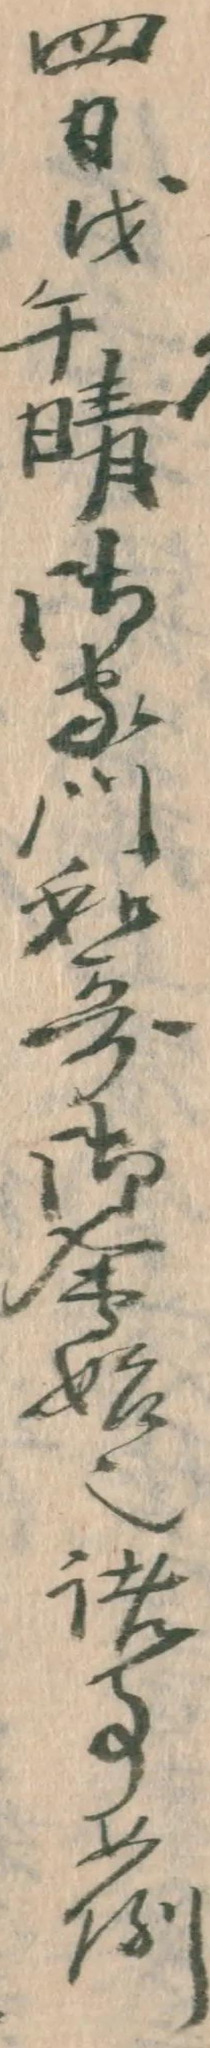四日戊午晴御家門和歌御會始也諸事如例
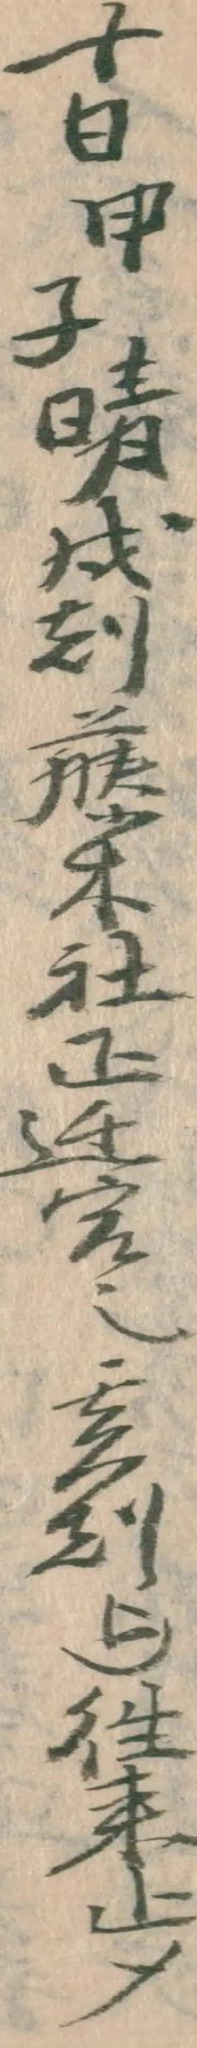十日甲子晴戌刻藤木社正遷宮也亥刻迄往来止メ
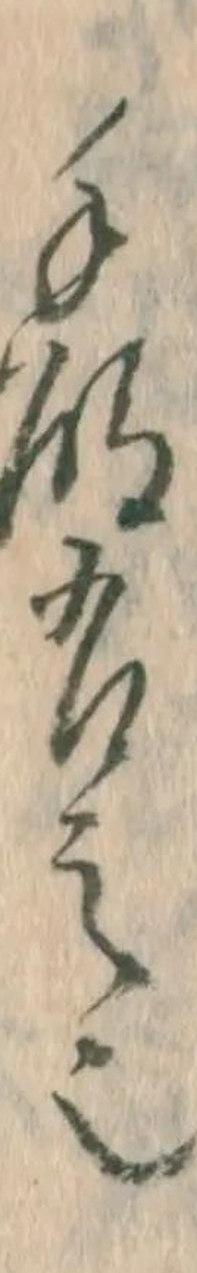手觸有之也
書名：賀茂社記録. 第67冊
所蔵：国立国会図書館 National Diet Library, JAPAN
